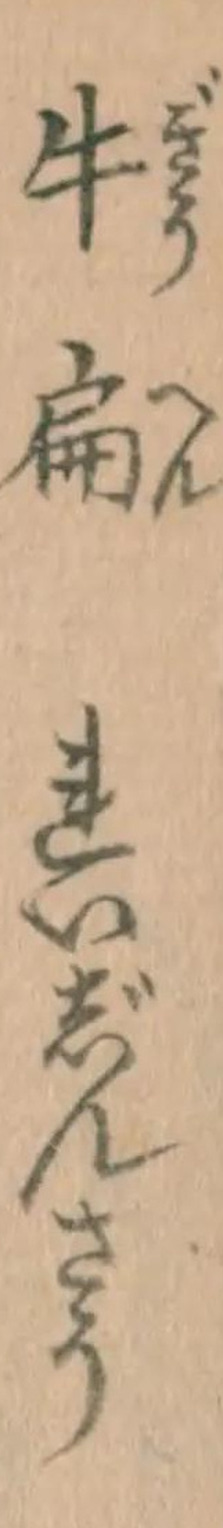牛扁れいじんさう
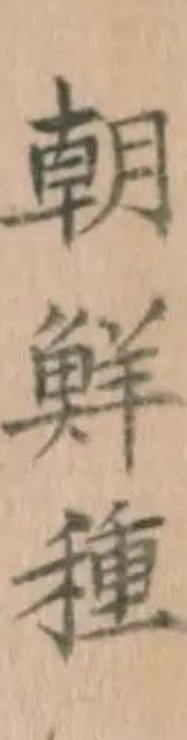朝鮮種

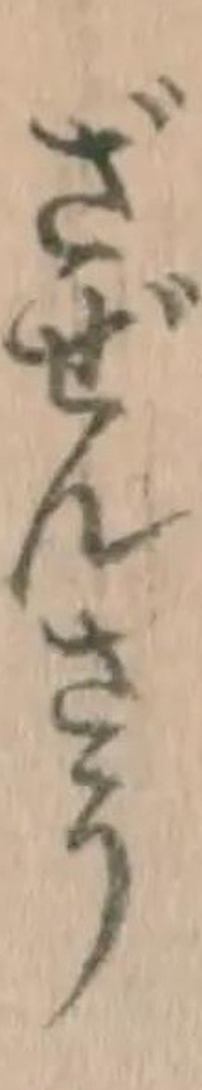ざぜんさう
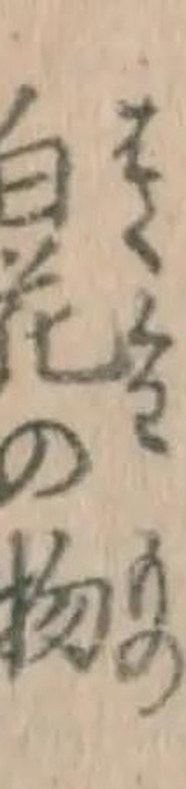白花の物
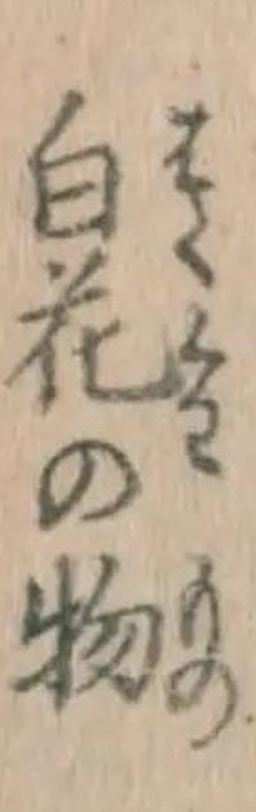白花の物
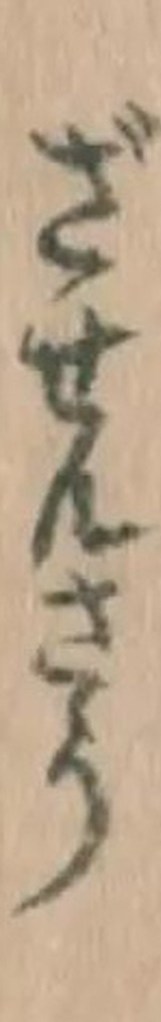ざせんさう

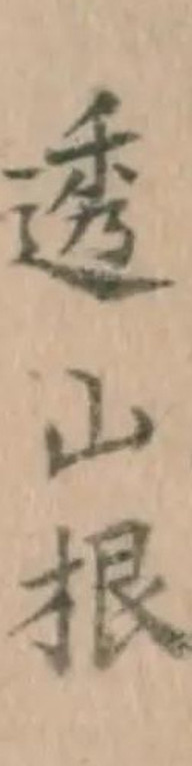透山根

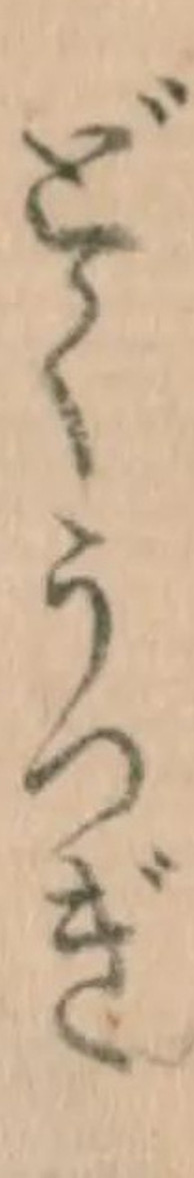とくうつき
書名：本草図譜. 巻22-24
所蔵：国立国会図書館 National Diet Library, JAPAN
